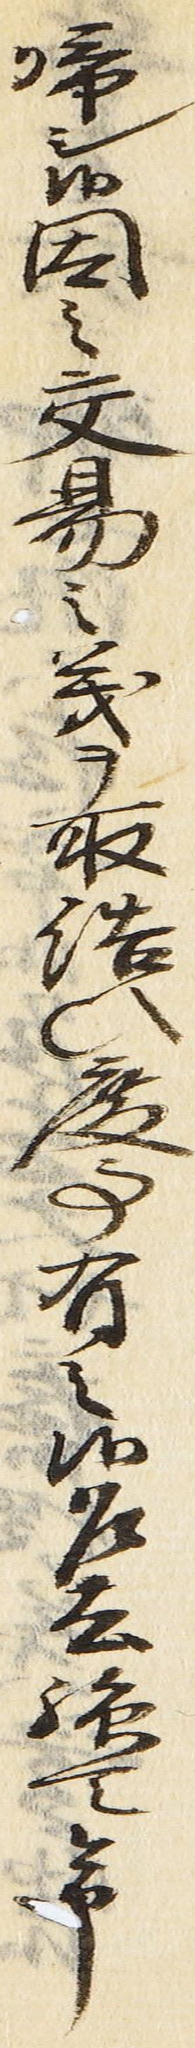帰し候因之交易之義を取詰ひ度事有之候乍去強てと申
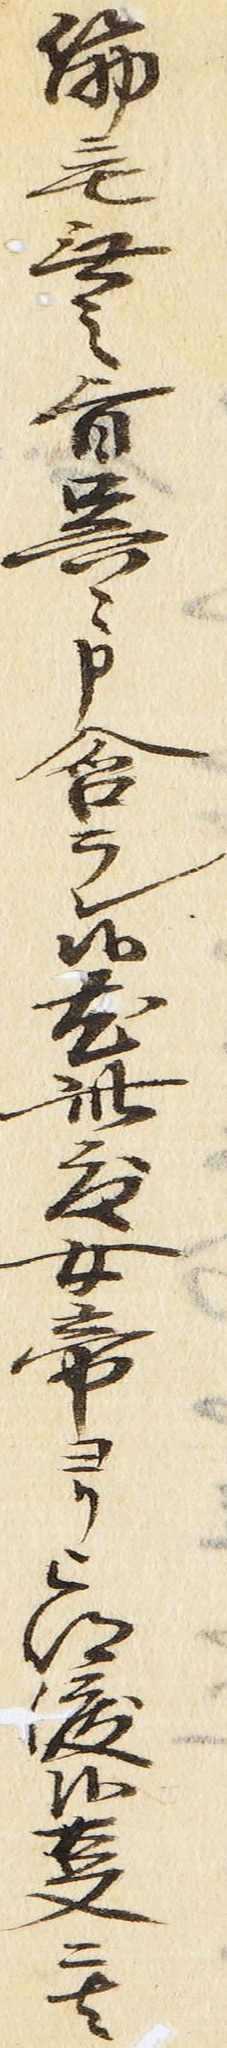筋にも無之旨呉々申含られ候尤此度女帝より被仰渡候事には
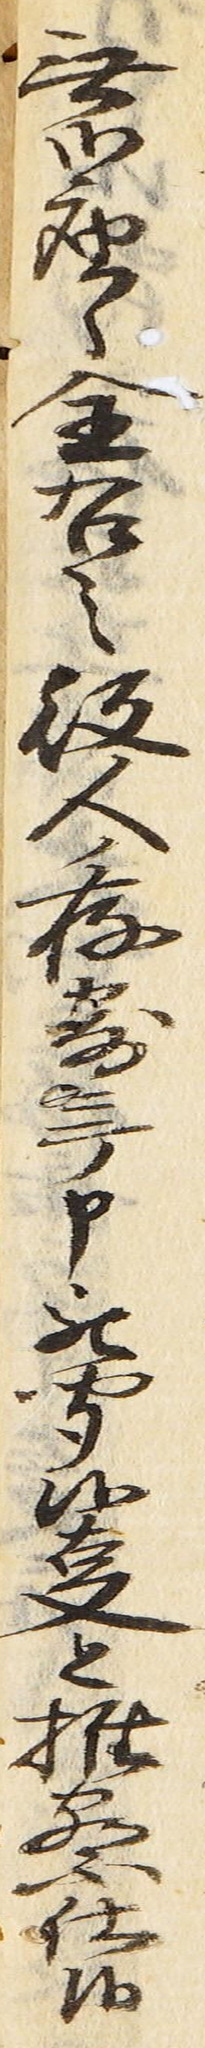無御座候全右之役人の存寄にて申被聞候事と推察仕候
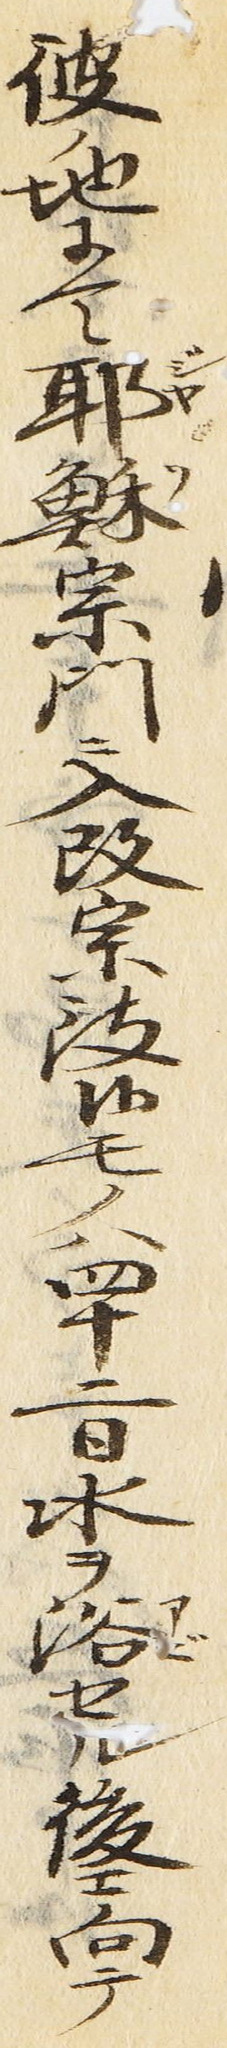彼の地にて耶蘇宗門に入改宗致候ものは四十二日水を浴せる後え向て
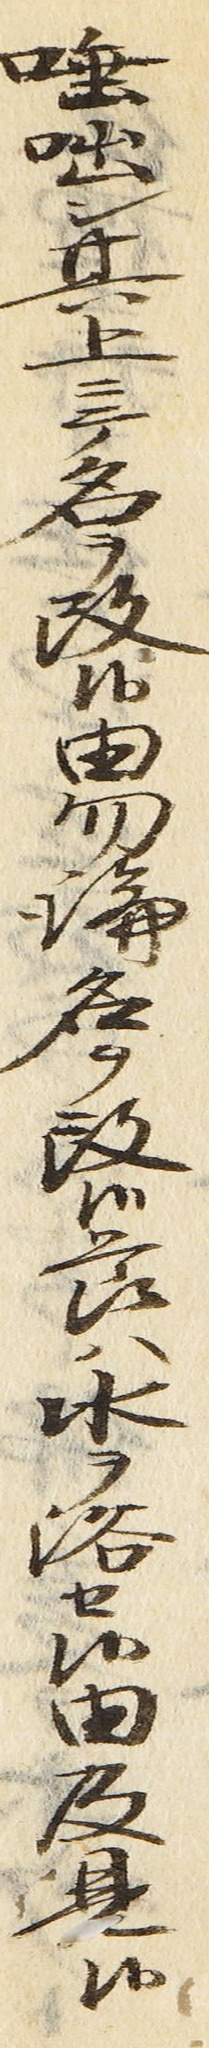唾咄し其上にて名を改る由勿論名を改候節は水を浴せ候由及見候
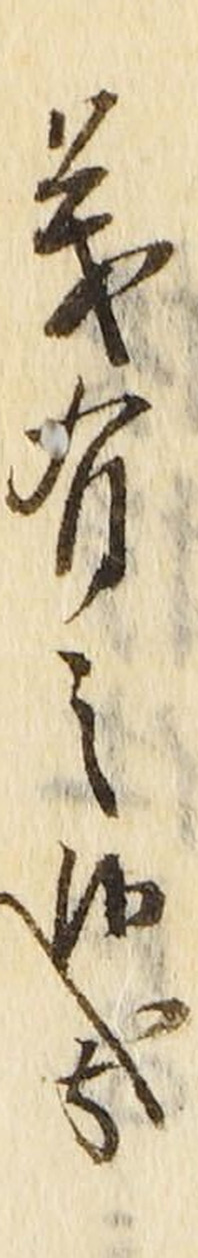義有之候哉
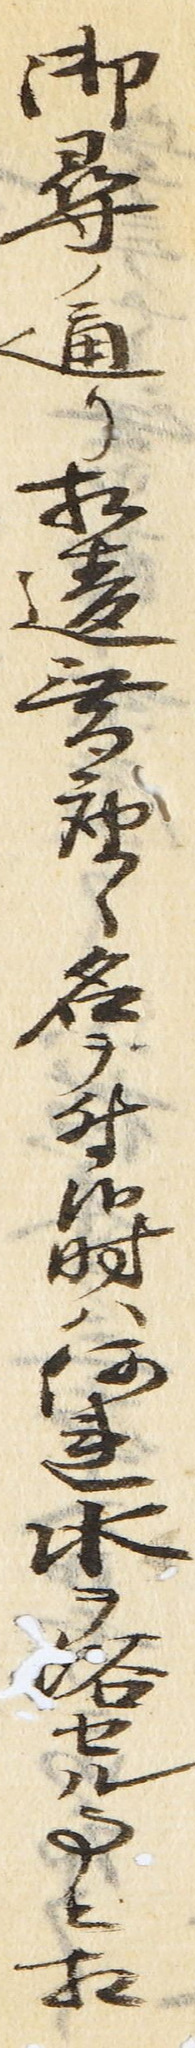御尋の通り相違無御座候名を付候時は何れ水を浴せる事と相
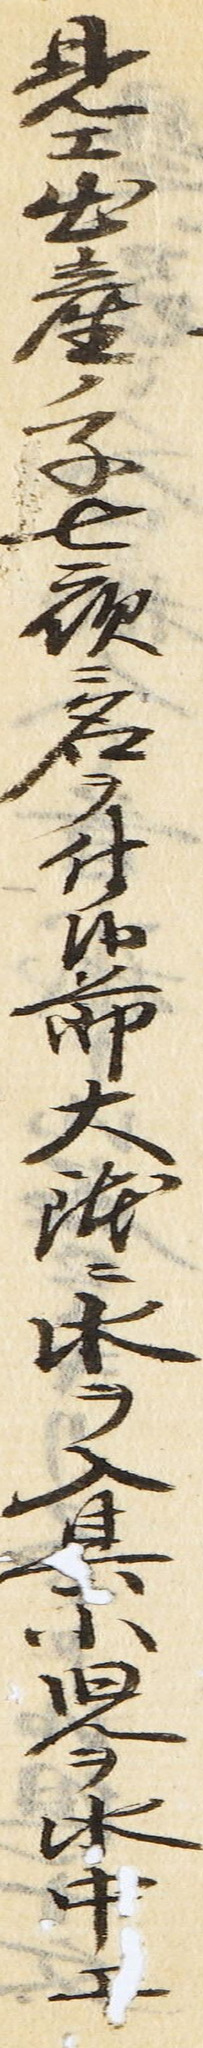見え出産の子七夜に名を付候節大鉢に水を入其小児を水中え
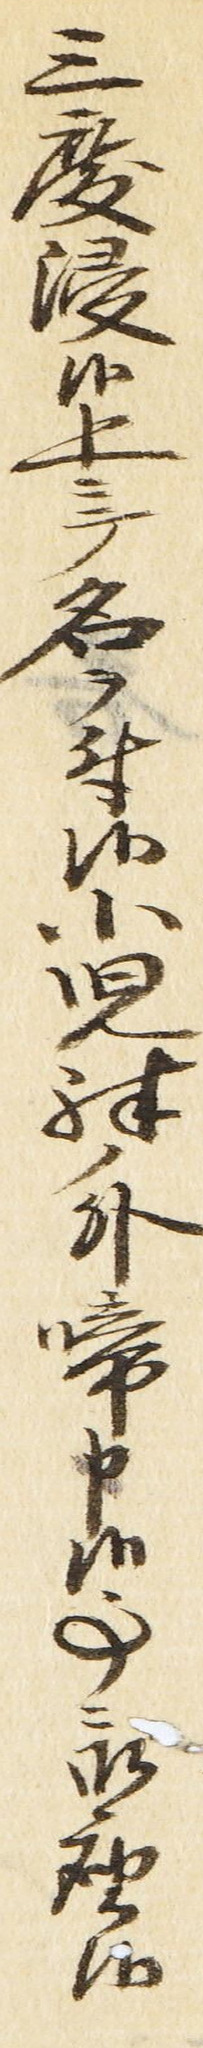三度浸候上にて名を付候小児殊の外啼申候事に御座候
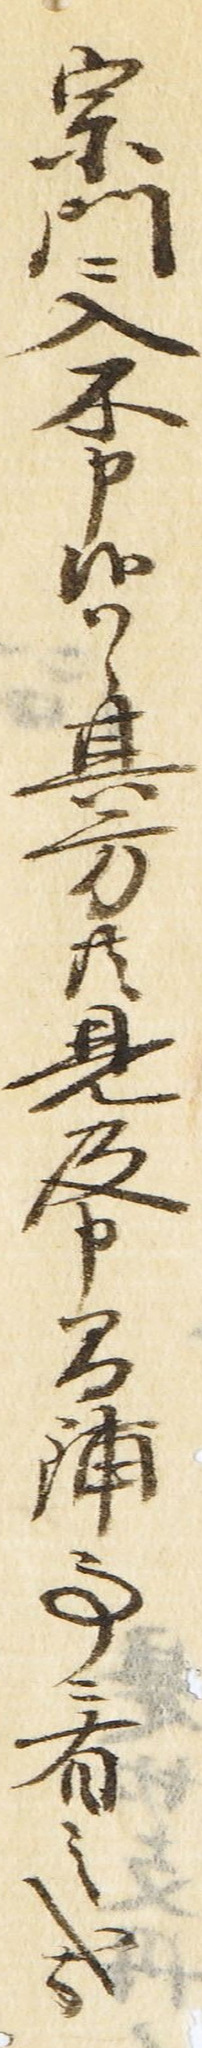宗門に入不申候はゝ其方共見及申間鋪事に有之哉
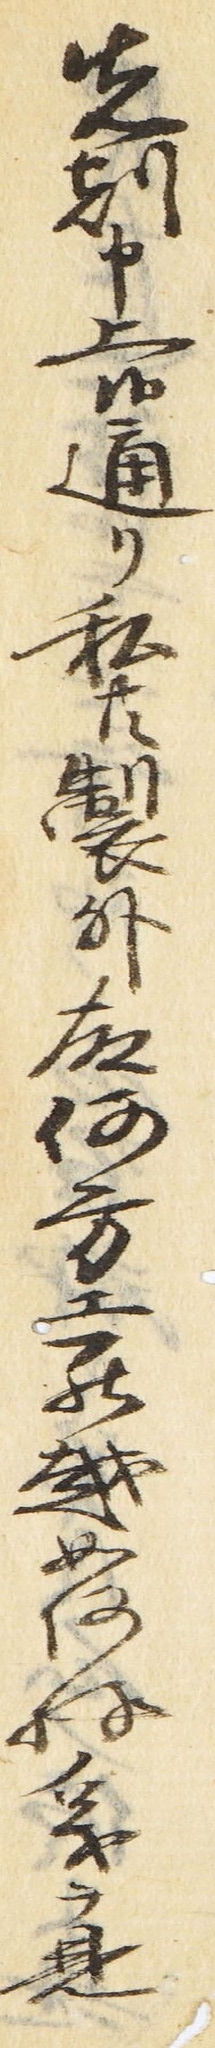先刻申上通り私共製外故何方え罷越如何様の義を見

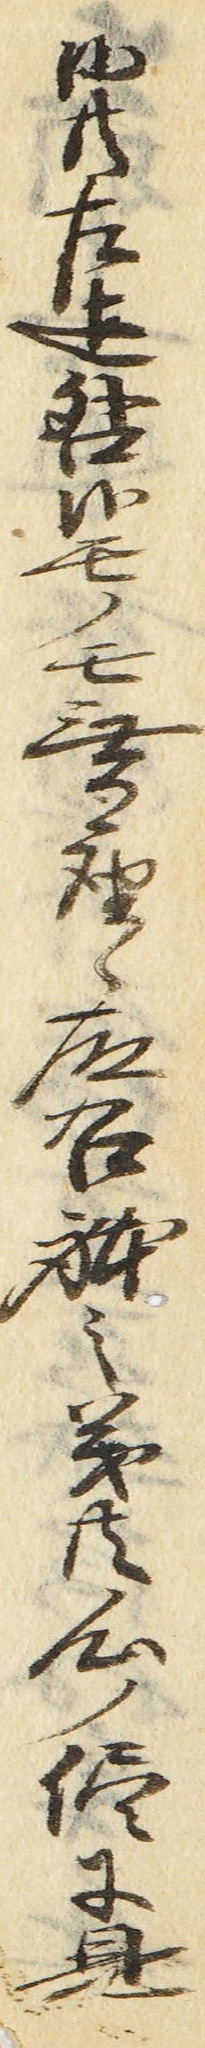候共左迄咎候ものも無御座候故右体之義共心の侭に見
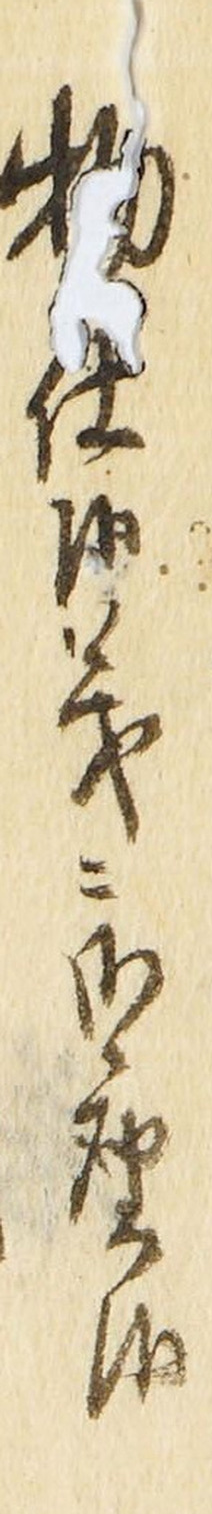物仕候義に御座候
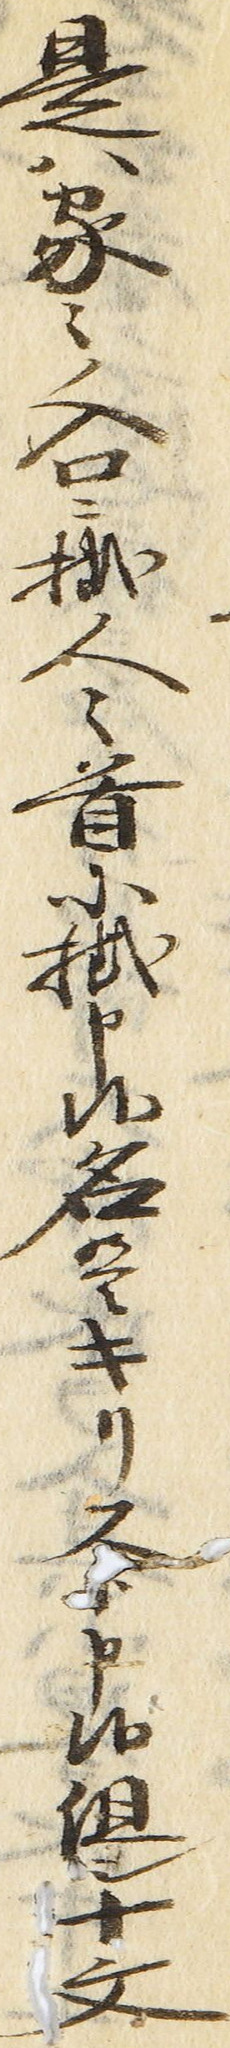是は家々の入口に掛人々首に掛申候名はキリスと申候但し十文
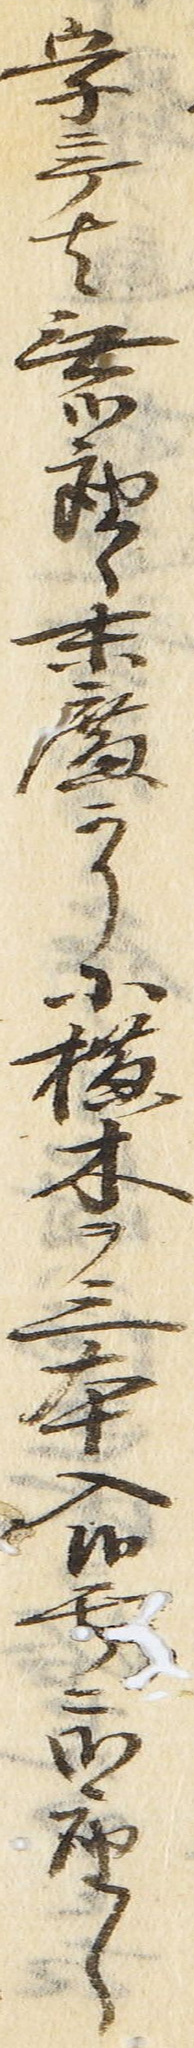字にては無御座候末広かりに横木を三本入候ものに御座候
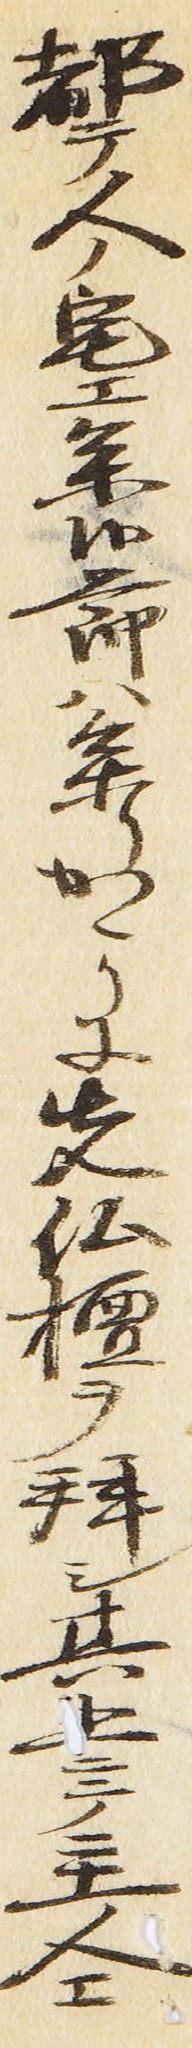都て人の宅え参候節は参りかゝりに先仏壇を拝し其上にて主人え
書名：神昌丸漂流問答
